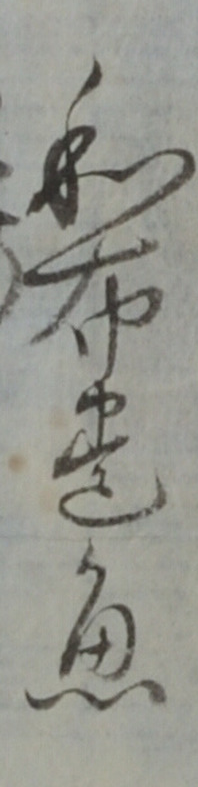和布巻魚
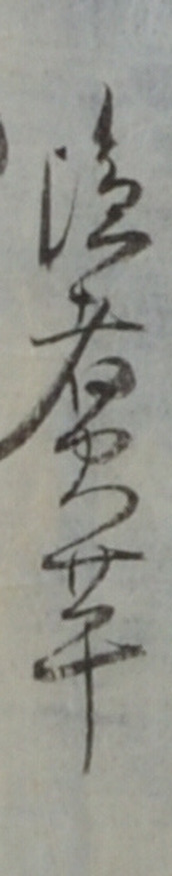塩煮芋
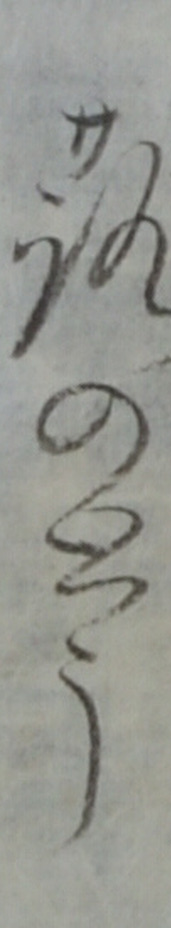蕗のとう
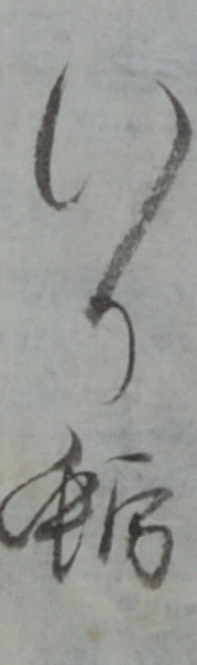いり蛎

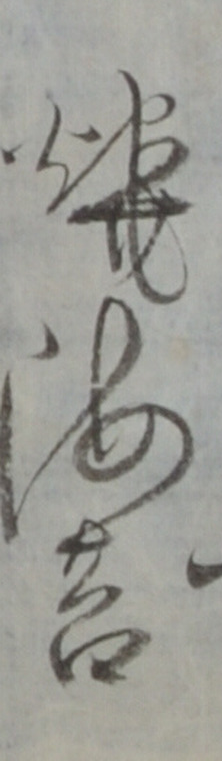焼海苔
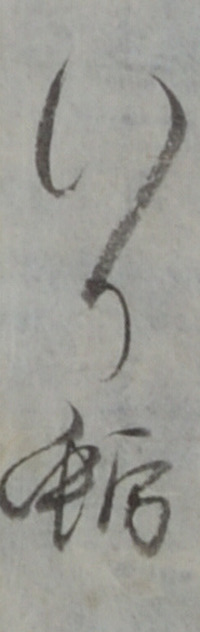いり蛎
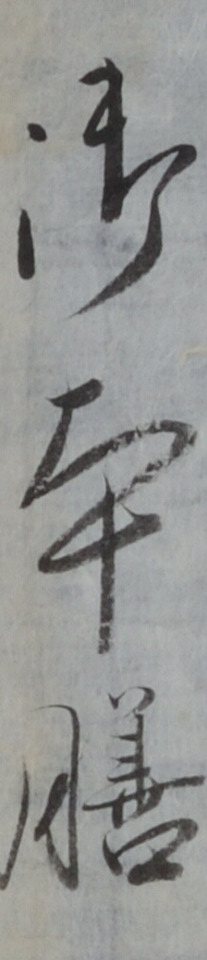御本膳
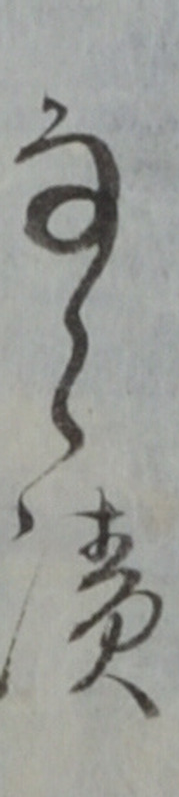なら漬
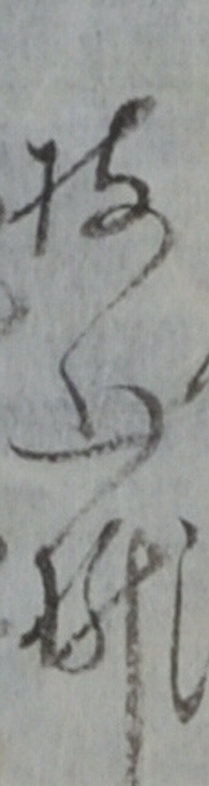枝山椒
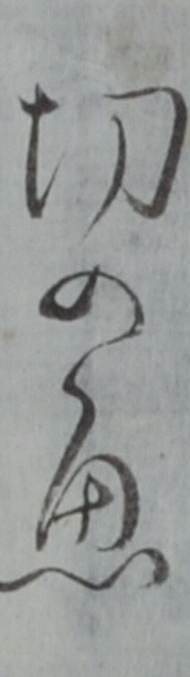切の魚
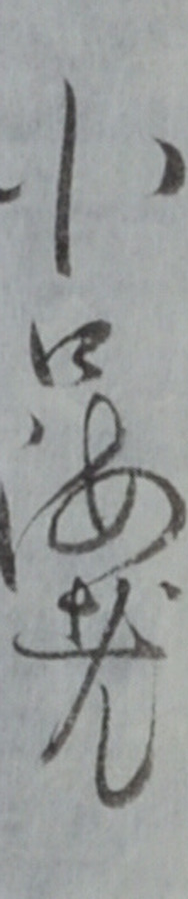小口海老
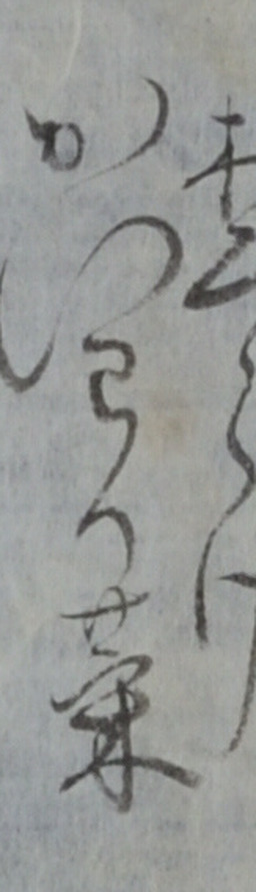かいわり菜
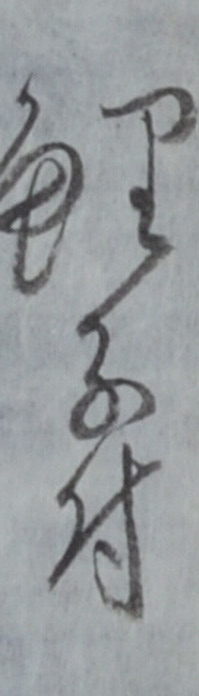鯉子付
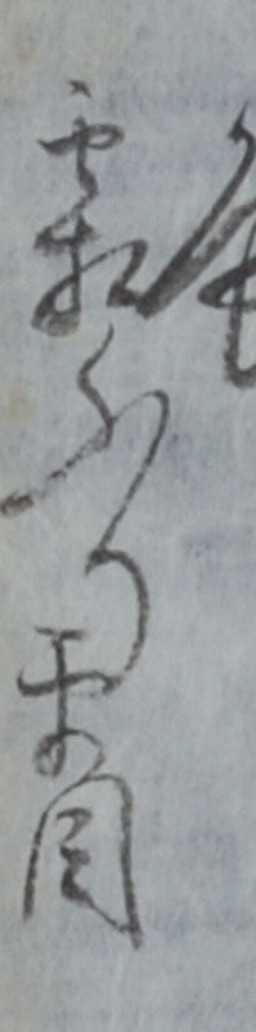霜ふり平目
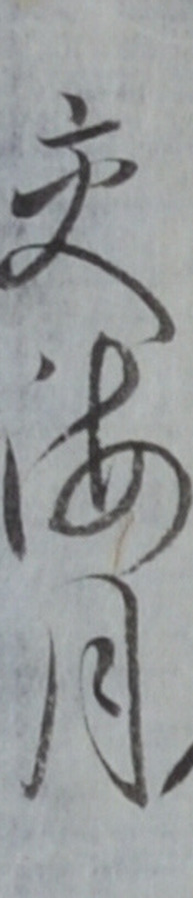交海月
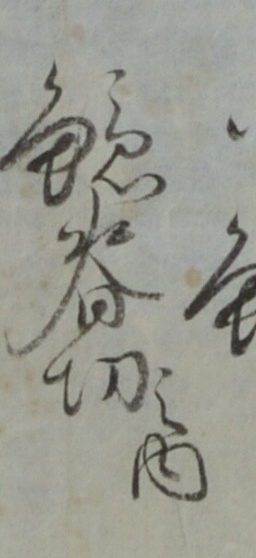鯨脊切之内
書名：献立書上
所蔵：伊那市立高遠町図書館・合同会社AMANE
